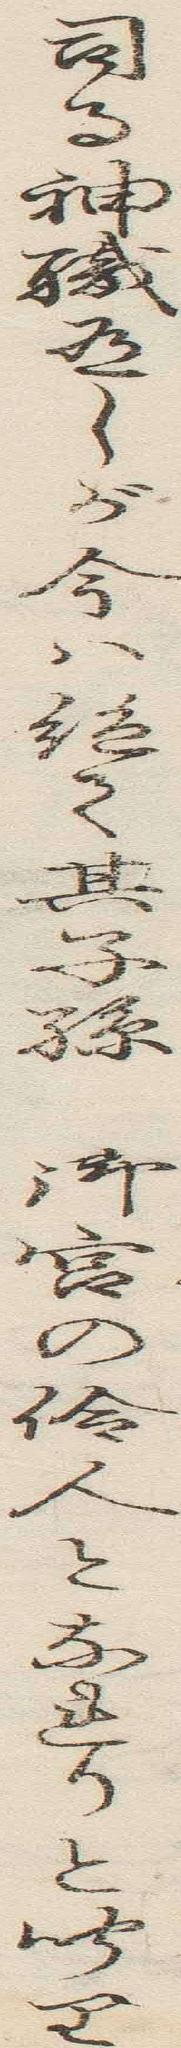司る神職有しが今は絶て其子孫御宮の伶人となれりと聞り
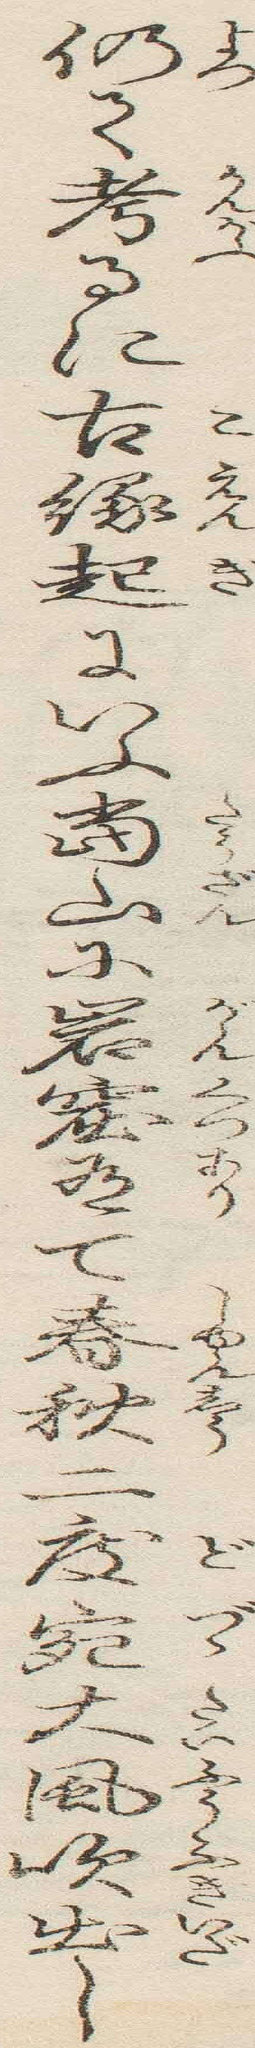仍て考るに古縁起にいふ當山に岩窟有て春秋二度宛大風吹出し
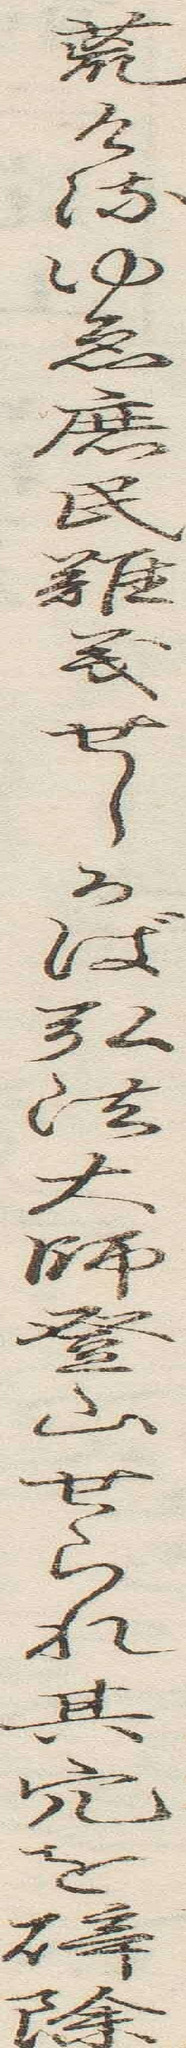荒けるゆゑ庶民難義せしかば弘法大師登山せられ其穴を辟除
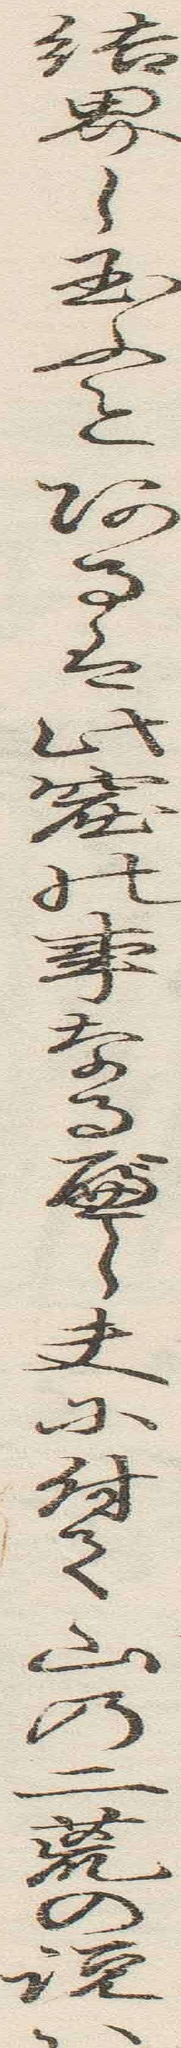結界し玉ふとあるは此窟の事なるべし夫に付て山の二荒の説は
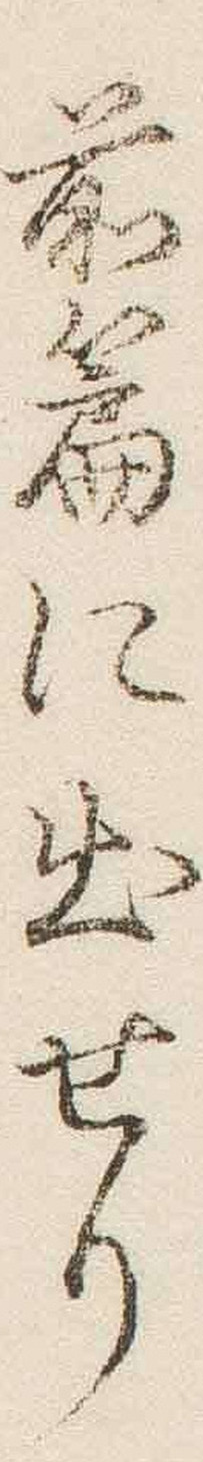前篇に出せり
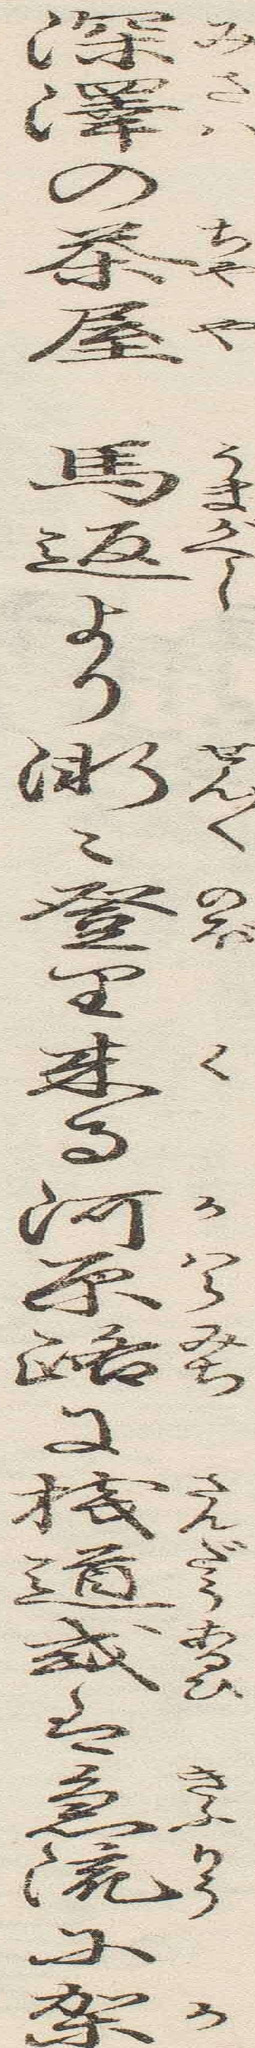深澤の茶屋馬返より漸〻登り來る河原路に棧道或は急流に架
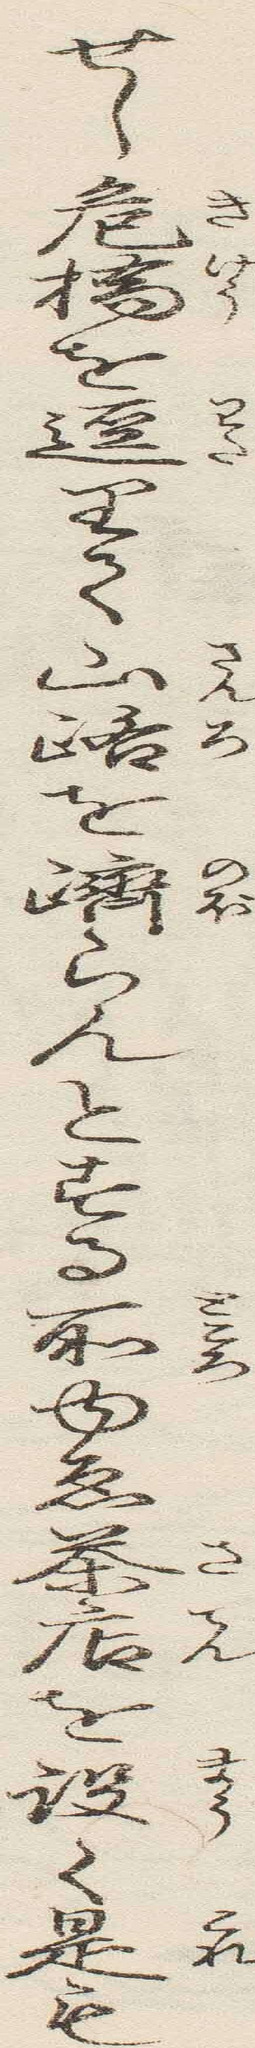せし危橋を逕りて山路を躋らんとする所ゆゑ茶店を設く是も
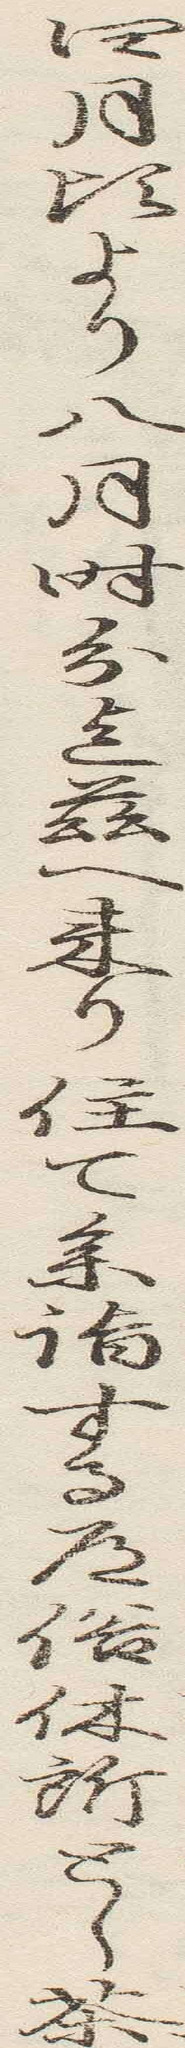四月頃より八月时分迄兹に來り住て参詣する道俗休所とし茶
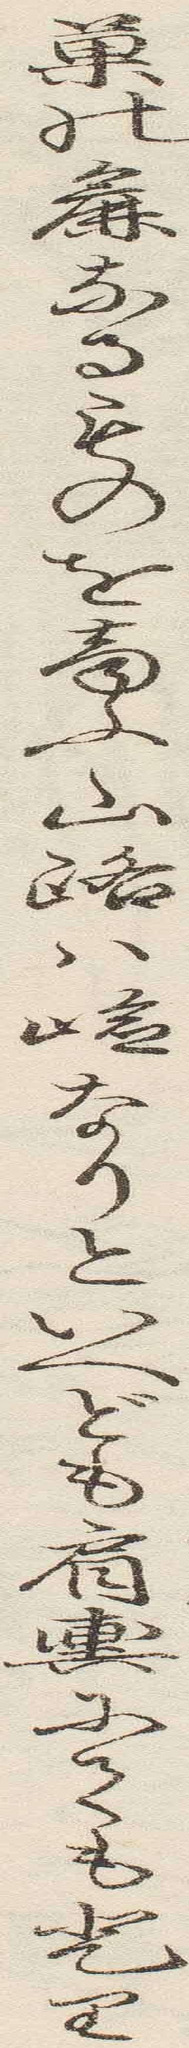菓の麁なるものを商ふ山路は嶮なりといへども肩輿にても登り
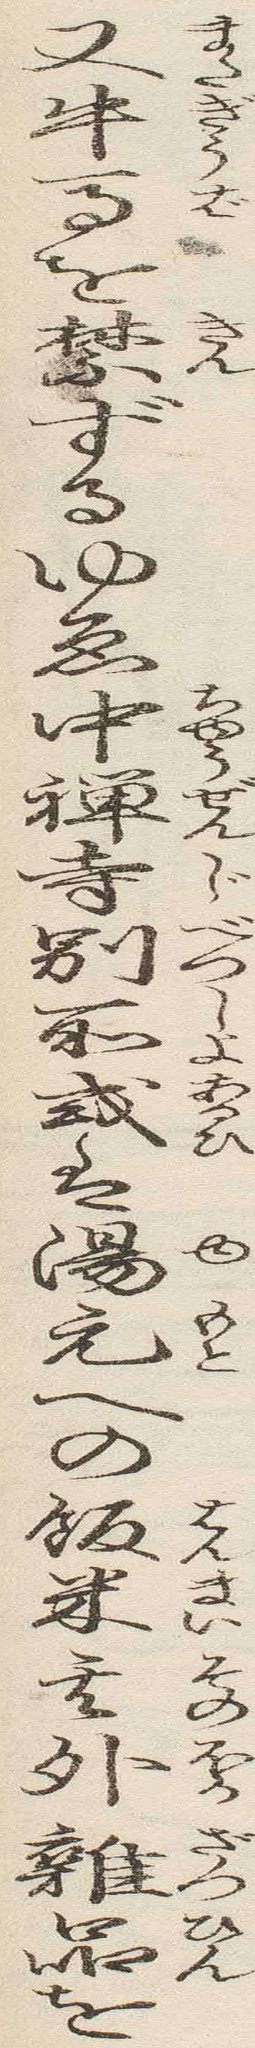又牛馬を禁ずるゆゑ中禅寺別所或は湯元への飯米其外雜品を
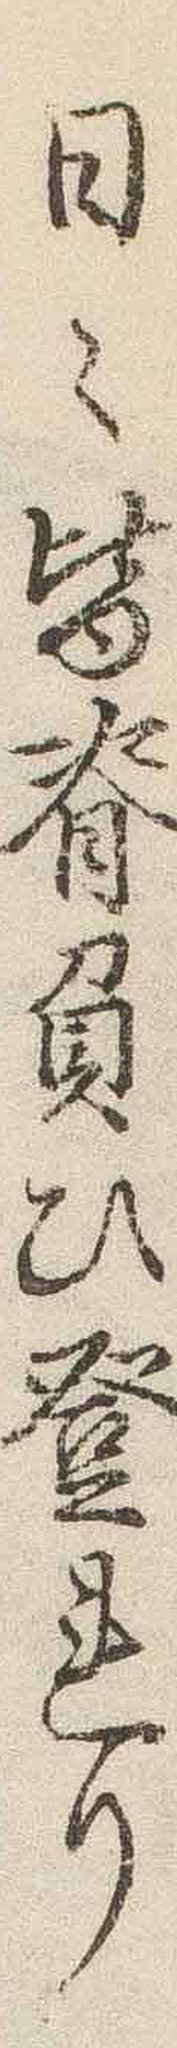日〻皆脊負ひ登れり
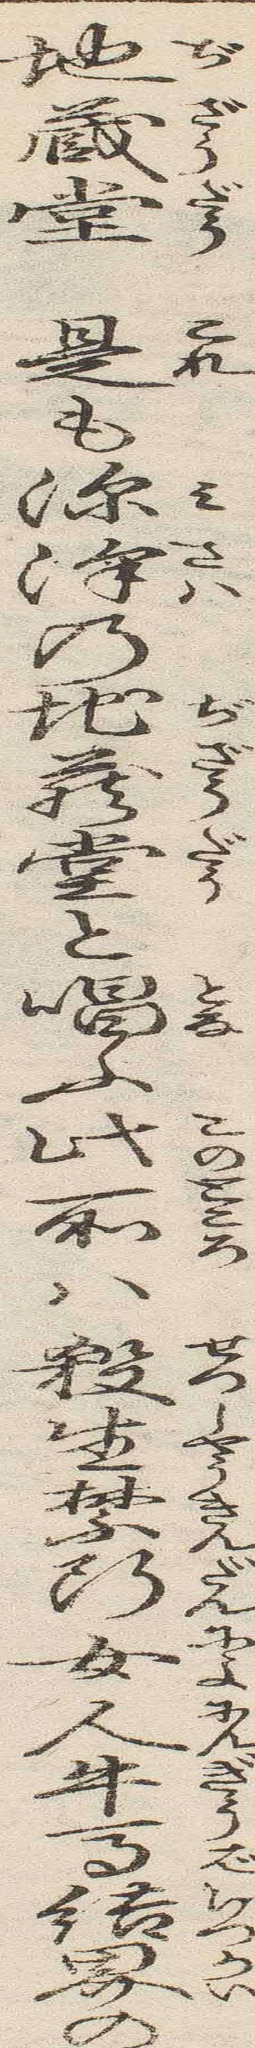地蔵堂是も深澤の地蔵堂と唱ふ此所は殺生禁断女人牛馬結界の
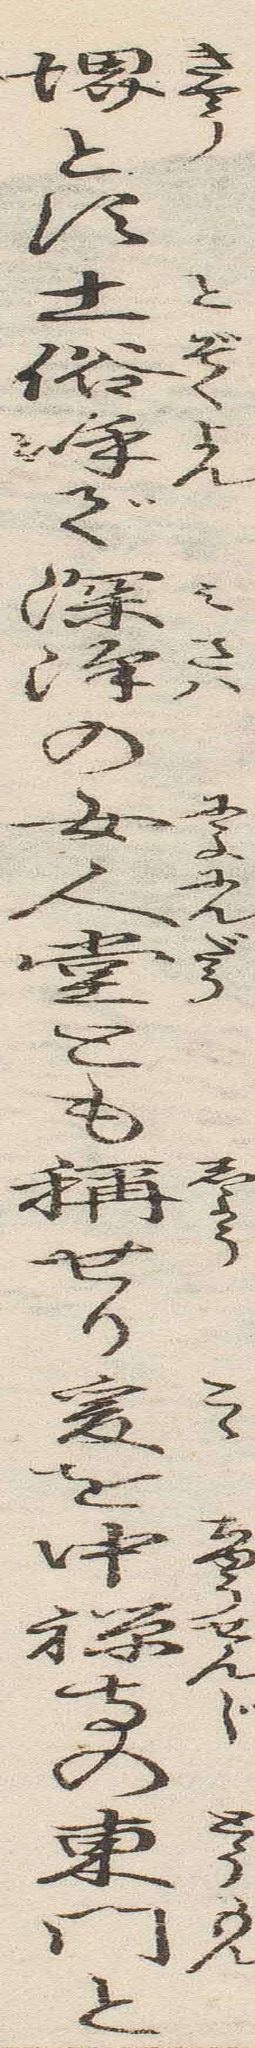堺とす土俗呼で深澤の女人堂とも稱せり爰を中禅寺の東門と
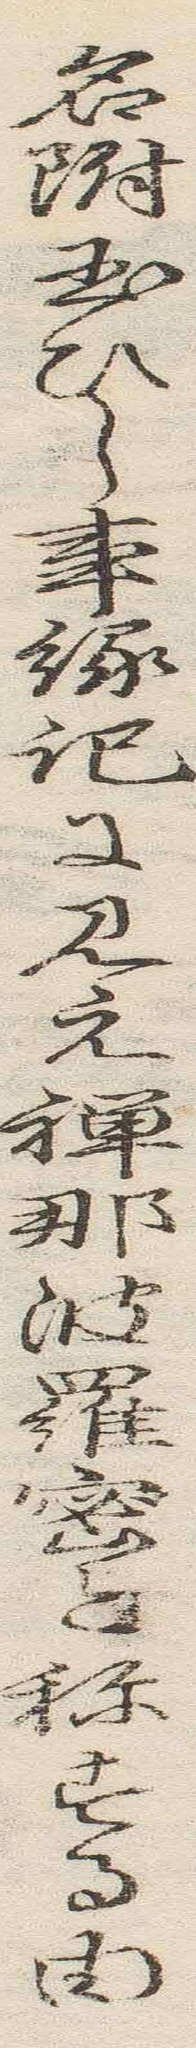名附玉ひし事縁起に見え禅那波羅密と称する由
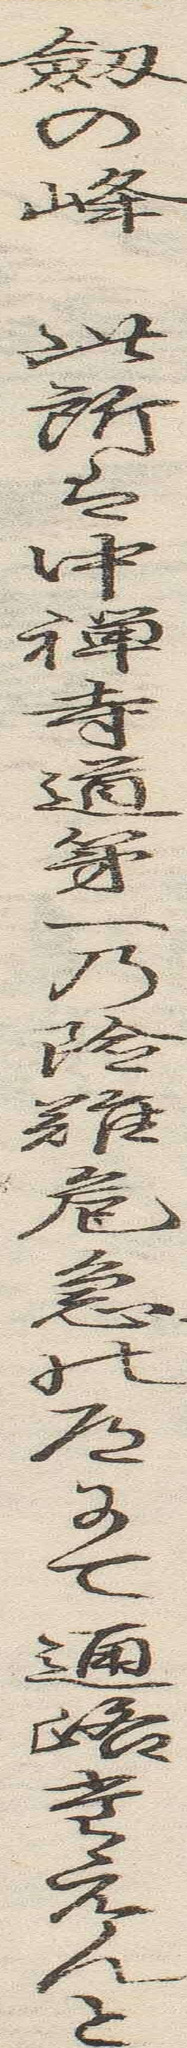劔の峰此所は中禅寺道第一の險難危急の道にて通路たえんと
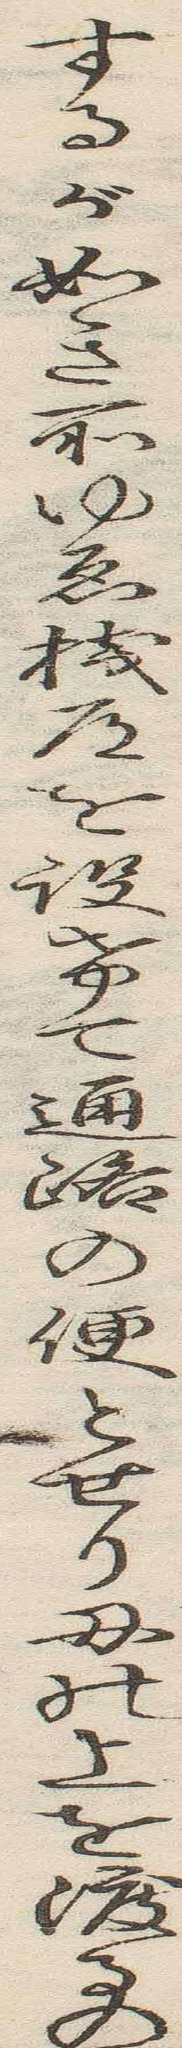するが如き所ゆゑ棧道を設けて通路の便とせり刄の上を渡るの
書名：日光山志
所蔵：東京学芸大学附属図書館 国文学研究資料館
